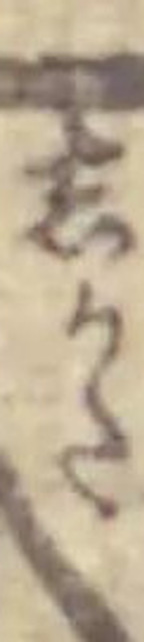しかた
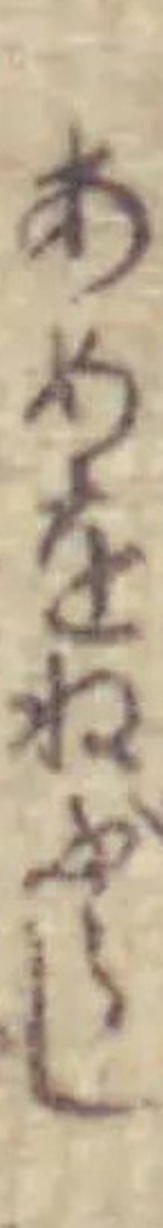あめをねぶらし
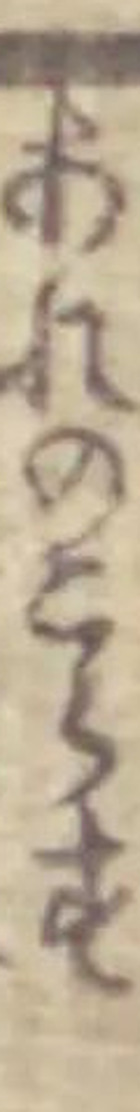あれのこらず
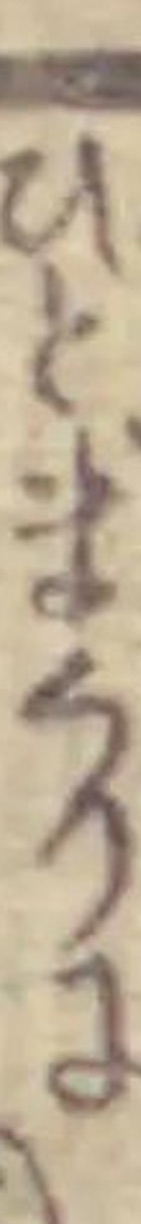ひとまくりに
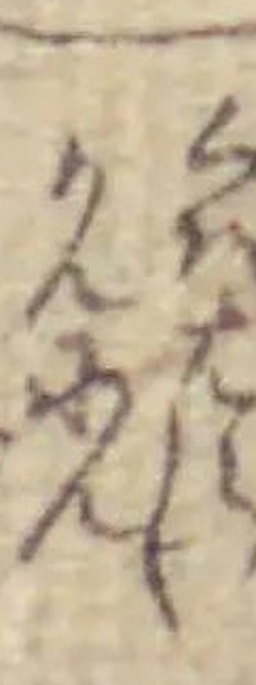かんにん
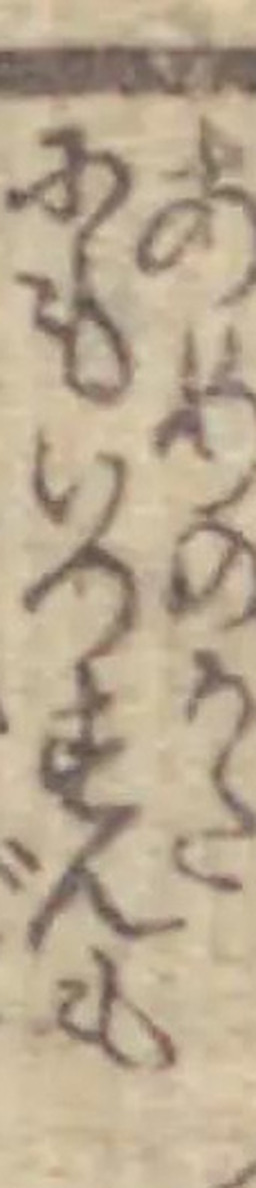にもいつすんも
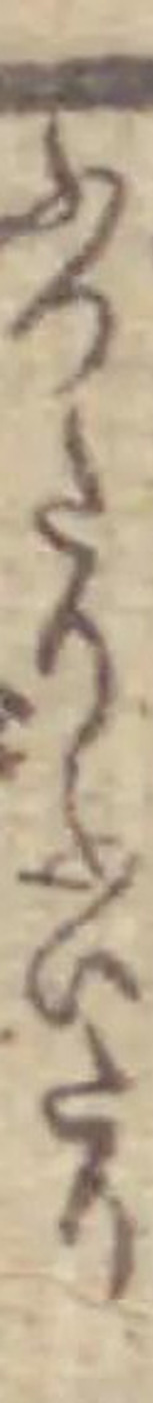ふつたりふいたり
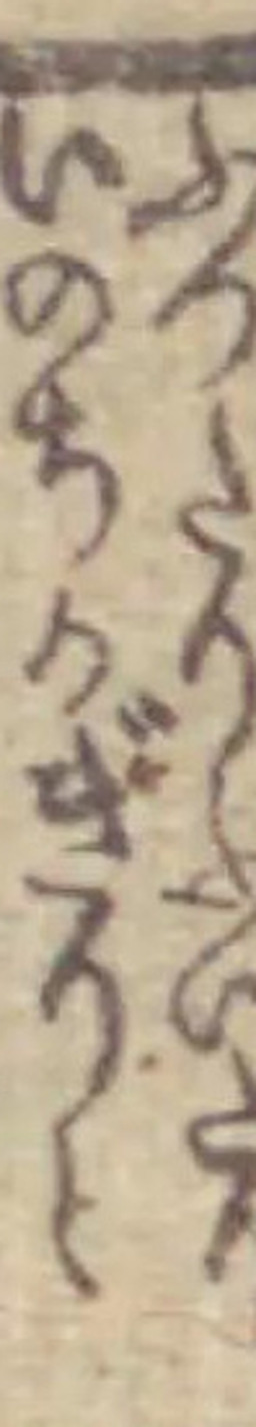いのちかぎりと
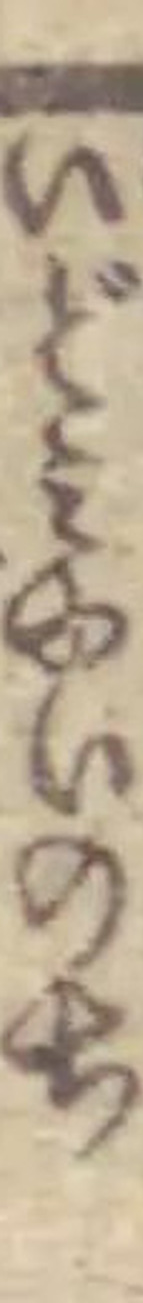いどみやいのち
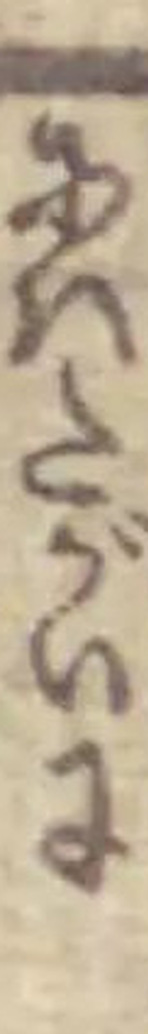にはたがいに
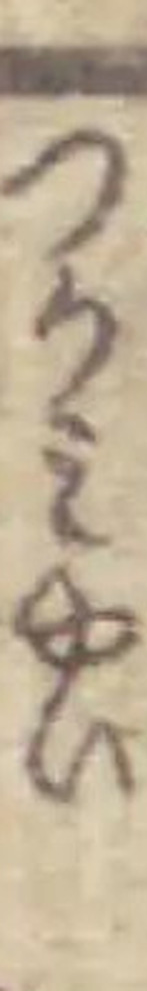つかみやい
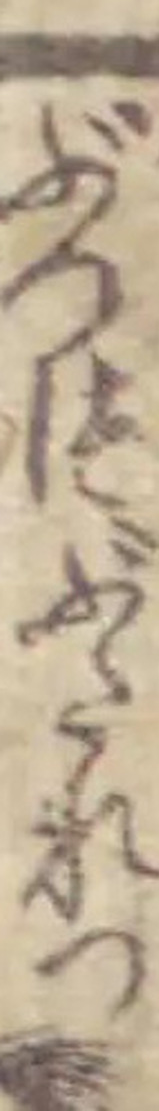ぶつつぶたれつ
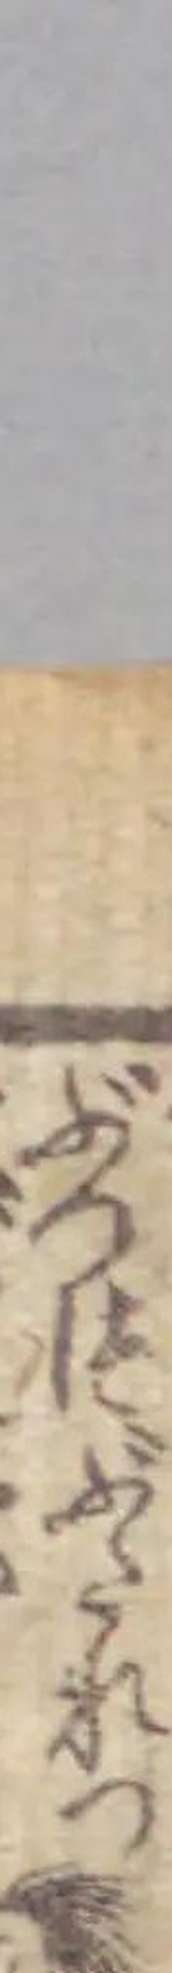ぶつつぶたれつ
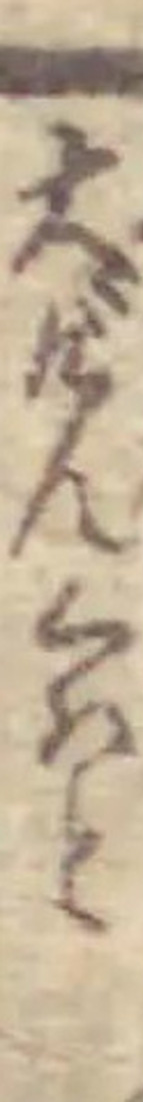大げんくはと
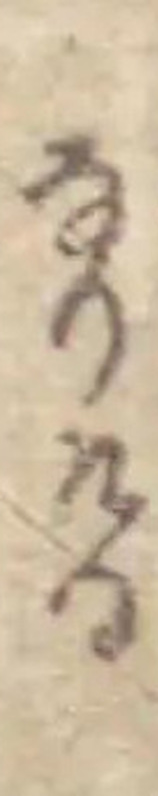なりける
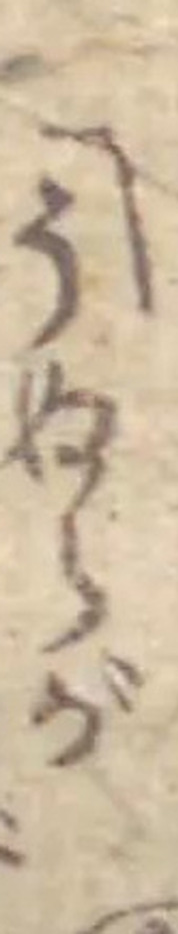〽うぬらが
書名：雨宮風宮出儘略縁記 3巻
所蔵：国立国会図書館 National Diet Library, JAPAN
